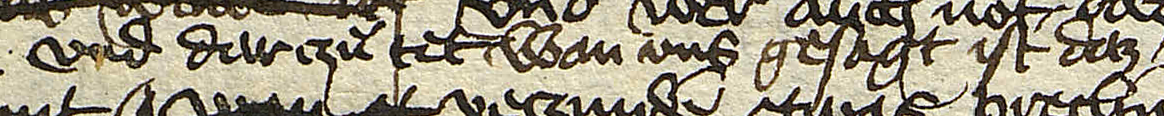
vnd darcʒu tet / wan vns geſagt iſt daʒ
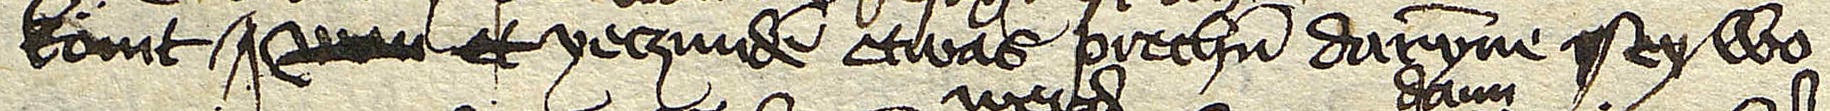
kömt / wan et yecʒunde* etwas prechn* dar*yne ſey / wo
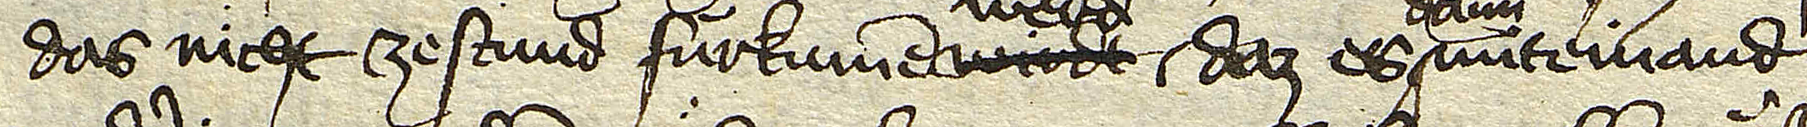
das nicht cʒeſtund fürkume* wirdt / daʒ es miteinand*
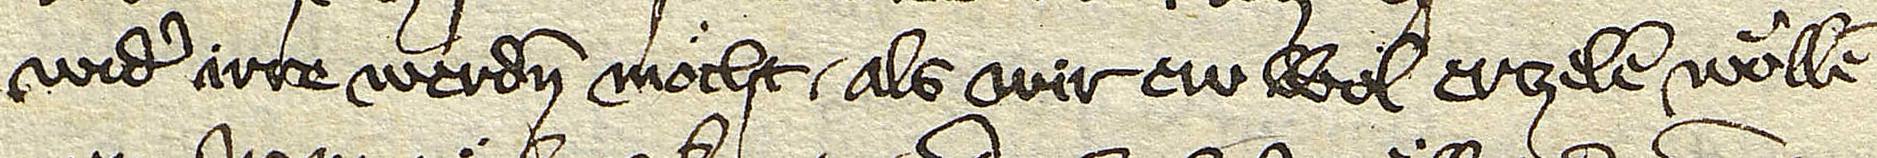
wid* irre werdn* möcht / als wir ew wol ercʒele* wölle*
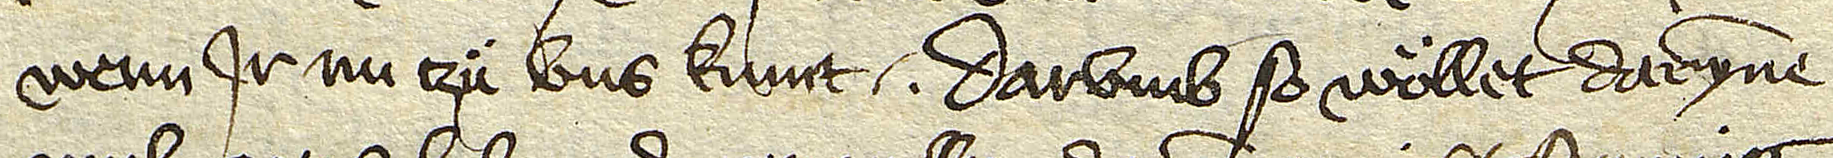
wenn Ir nu cʒü vns kumt / . Darvmb ſo wöllet dar*yne
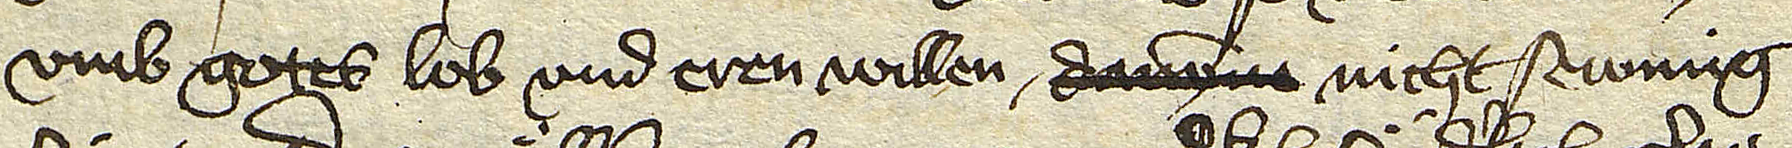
vmb gotes lob vnd eren willen / dar*yne nicht ſewmig
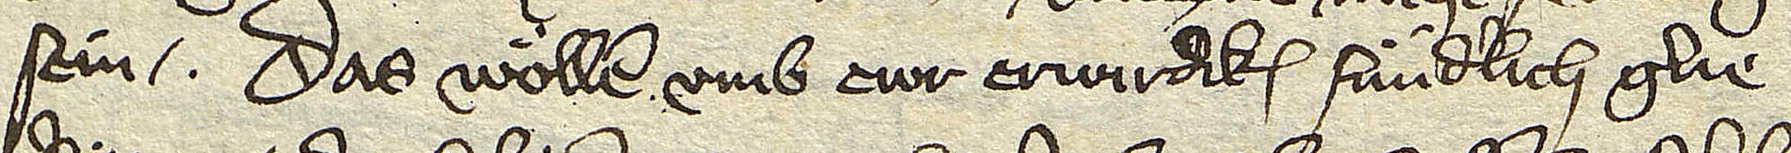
ſein / . Das wölle* vmb ewr erwirdik* ſünderlich g*ne
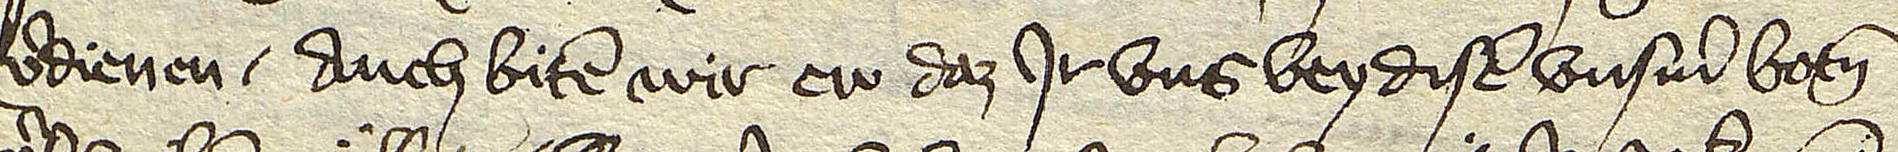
v*dienen / Auch bite* wir ew daʒ Ir vns bey diſe* vnſm* botn*
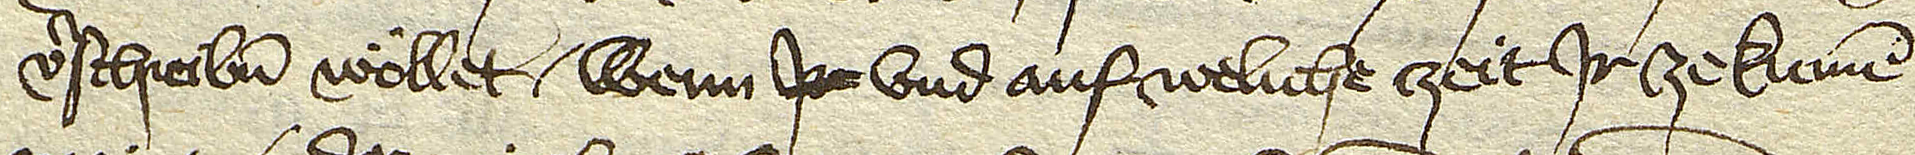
v*ſchreibn* wöllet / wenn Ir vnd auf weliche cʒeit Ir cʒekume*
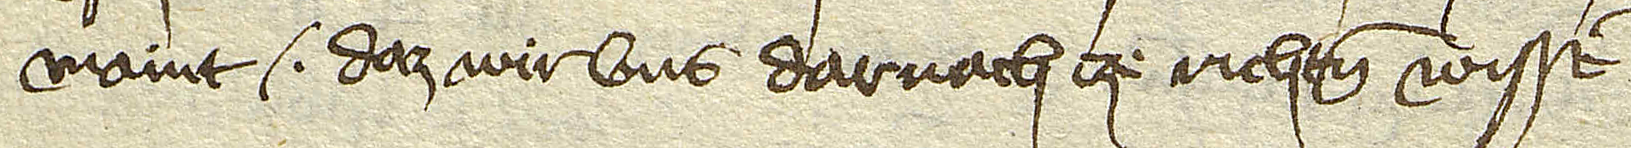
maint / . daʒ wir vns darnach cʒe richtn* wiſſe*
